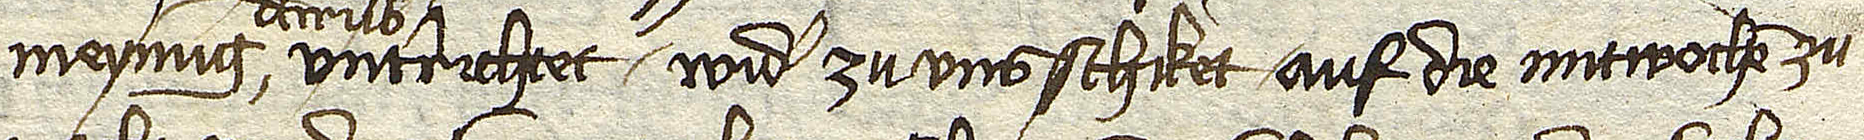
meynu*g vnt*richtet / wid* ʒu vns ſchiket / auf die mitwoche* ʒu
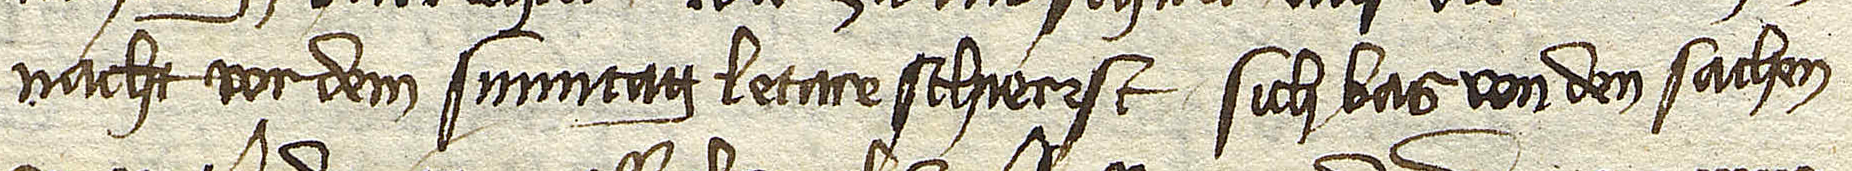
nacht vor dem ſunntag letare ſchieriſt / ſich bas von den ſachen
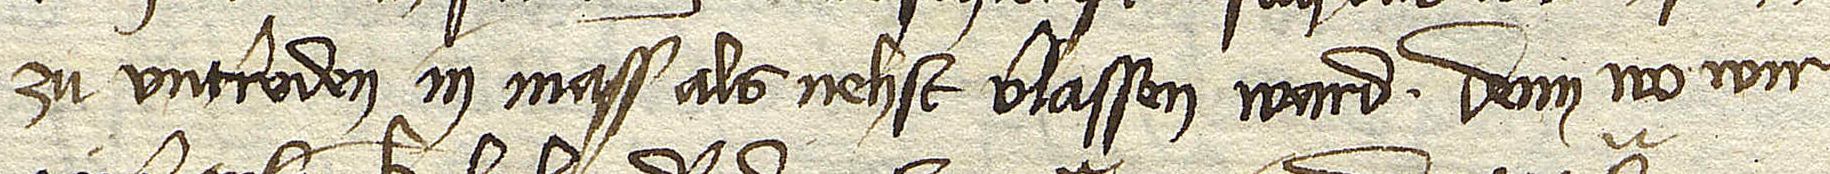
ʒu vnt*reden in maſſ als nehſt v*laſſen ward . Denn wo wir
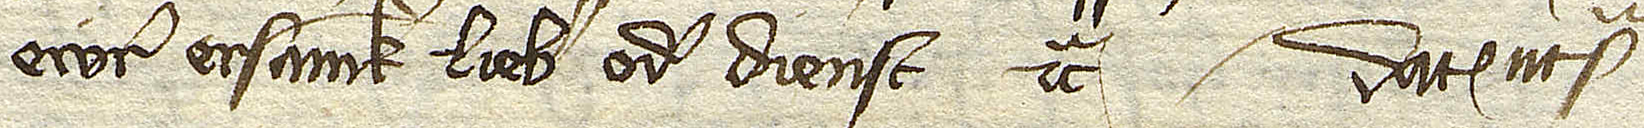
ew*r erſamk* lieb od* dienſt ec* / Dat* ut ſ*
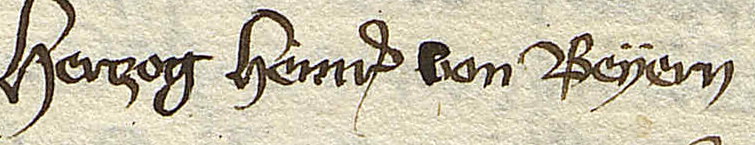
Hercʒog Heinr* von Beyern
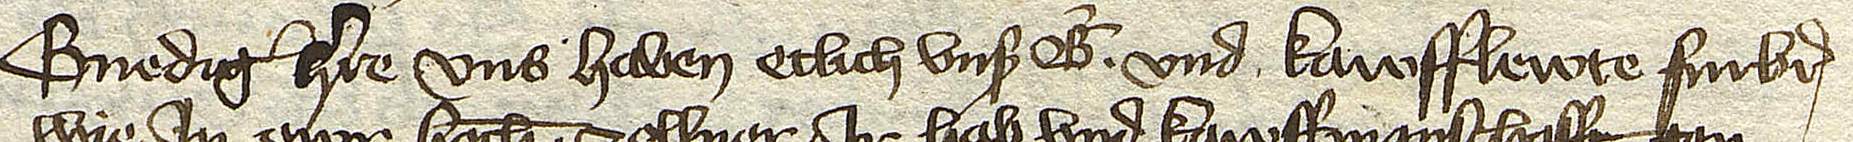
Gnedig* h*re vns haben etlich vnſ* B* . vnd kawfflewte furbr*
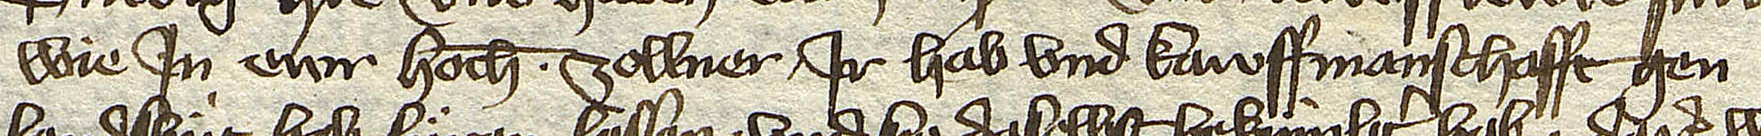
wie In ewr hoch* . cʒollner / Ir hab vnd kawffmanſchafft gen
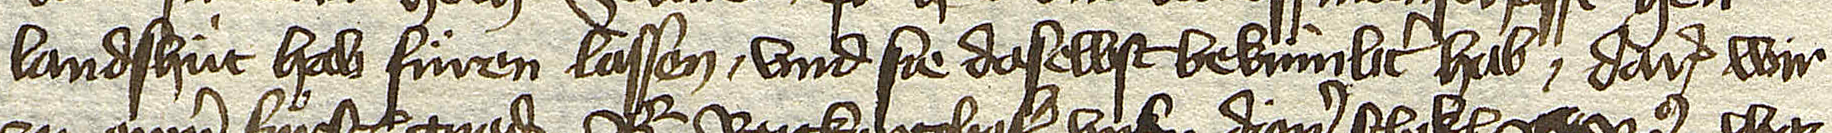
landſhüt hab füren laſſen / vnd ſie daſelbſt bekümlic* hab / dar* wir
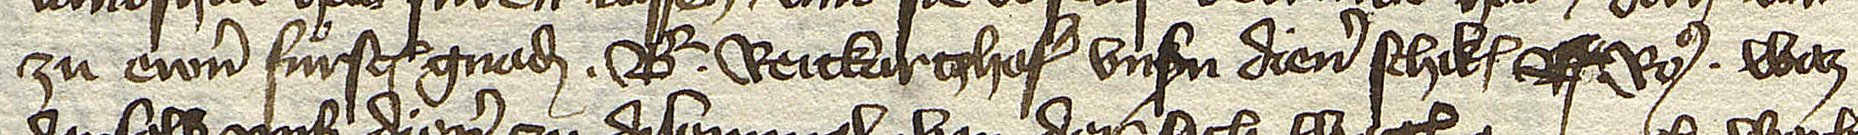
cʒu ew*n fürſt* gnad* . B* . Reickarcʒhof* vnſ*n dien* ſchik* R Ro* . waʒ
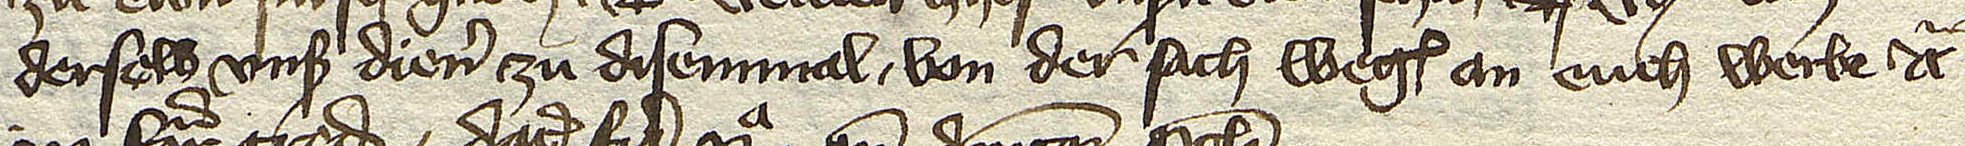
derſelb vnſ* dien* cʒu diſemmal / von der ſach weg* an euch werbe ec*
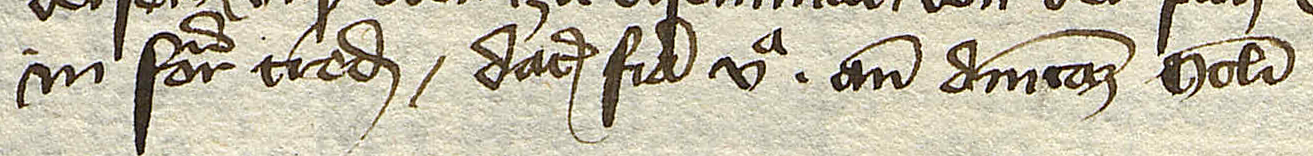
in for* cred* / dat* fia* v* . an* dnica* Ocli*
